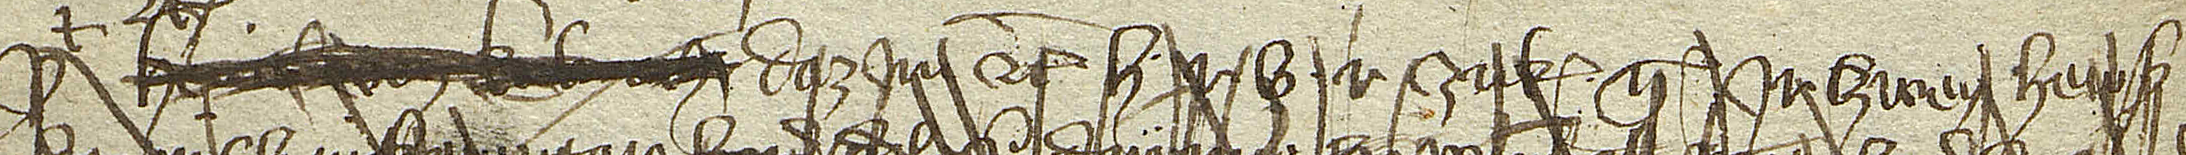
P* Heinr* von Kulmach* daʒ Im ec* h r b r cʒuk* g* Ir cʒwen hewſ*
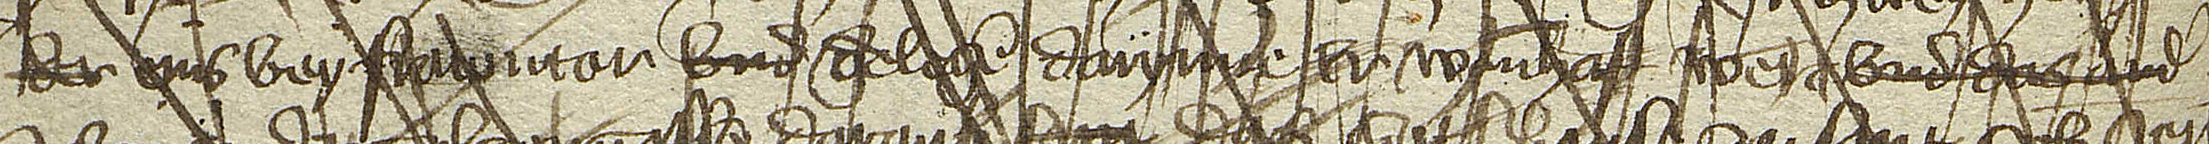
der eins bey frawntor vnd gelege* darynne* Er wonhaft wer / vnd das and*
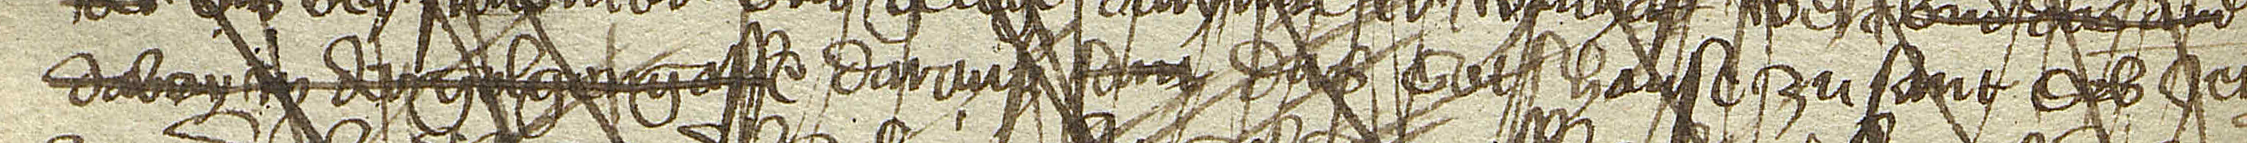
dabey in der golgergaſſe* darauſʒ ſant daſʒ Gotſhauſe cʒu ſant Seb Ierl*
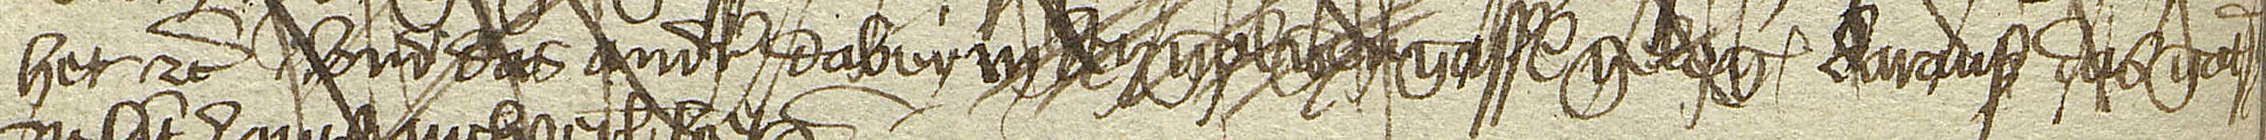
het ec* / vnd das andr* dabey in der golgengaſſe* geleg* darauſʒ das got*
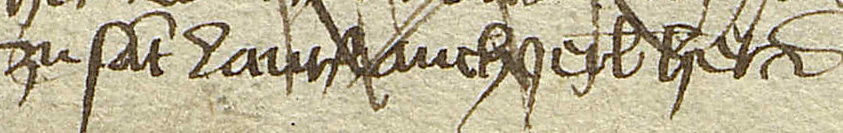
cʒu ſat* Laur* auch Ierl* her ec* /
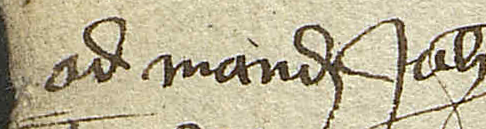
ad mand* Ioh*
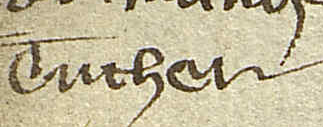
Tucher
